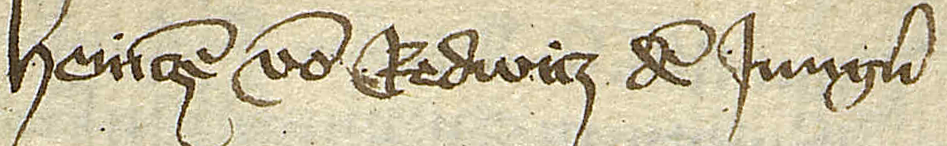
heincʒe* vo* Redwicʒ d* Iungn*
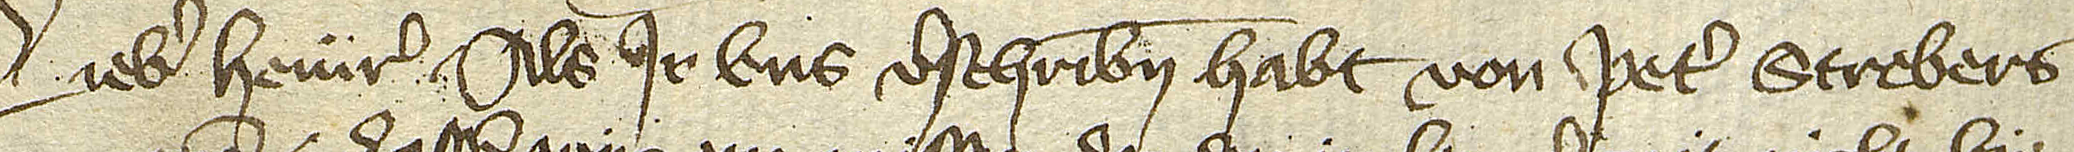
Lieb* heinr* / Als Ir vns v*ſchribn* habt von Pet* Strebers
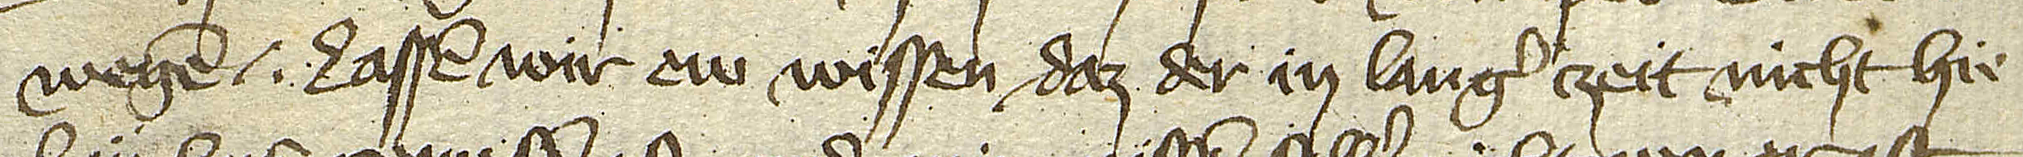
wege* / . Laſſe* wir ew wiſſen / daʒ der in lang* cʒeit nicht hie
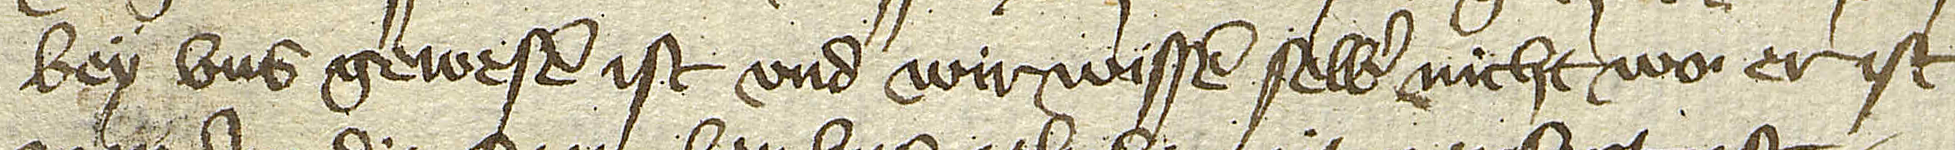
bey vns geweſe* iſt vnd wir wiſſe* ſelb* nicht wo er iſt
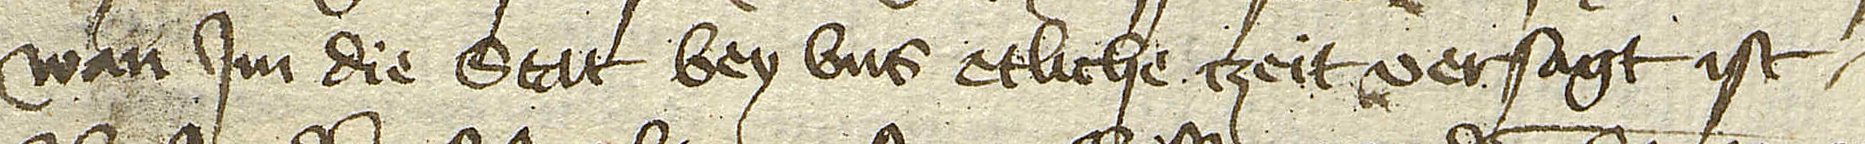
wan Im die Stat bey vns etliche cʒeit verſagt iſt /
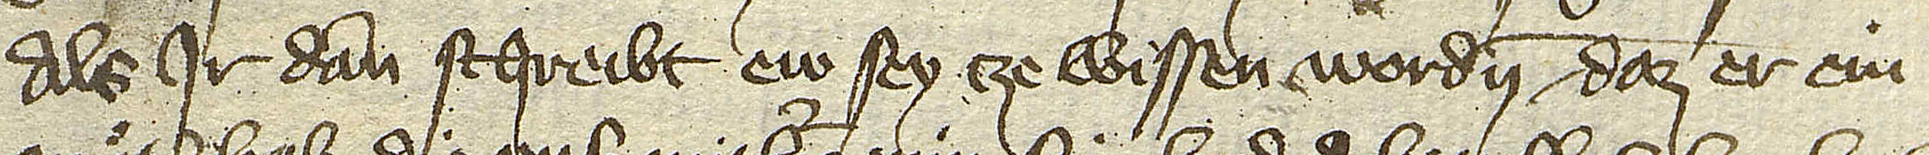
Als Ir dan* ſchreibt ew ſey cʒe wiſſen wordn* / daʒ er ein
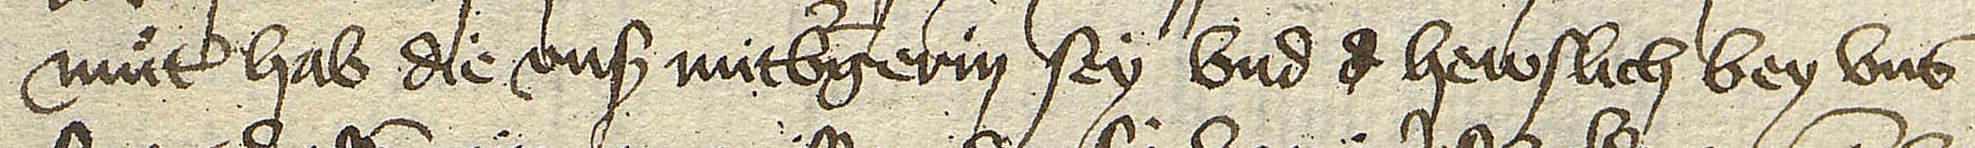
müt* hab die vnſ* mitb*gerin ſey vnd d hewſlich bey vns
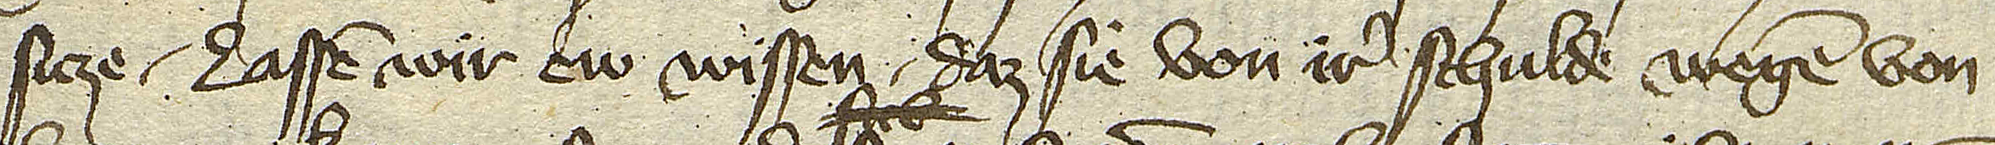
ſicʒe / Laſſe* wir ew wiſſen / daʒ ſie von ir* ſchulde wege* von
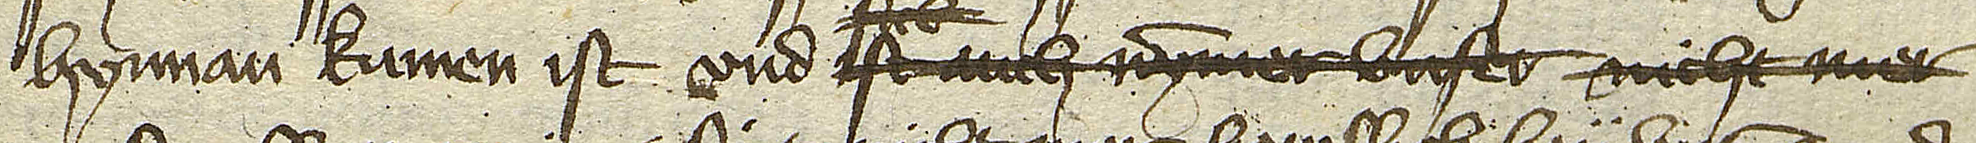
hynnan kumen iſt vnd iſt auch nymer vnſer nicht mer
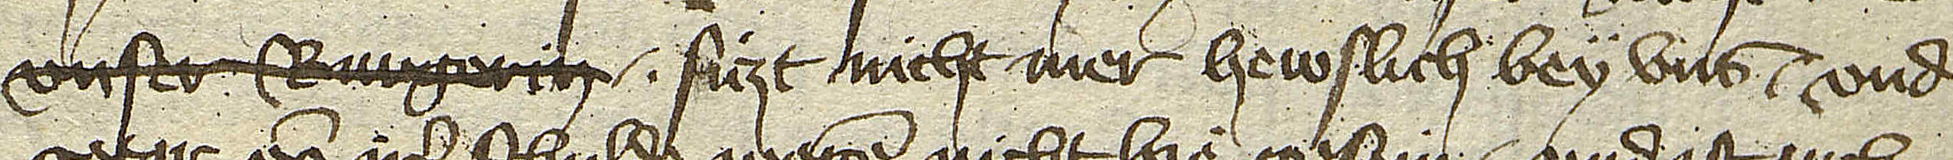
vnſer Burgerin / . ſicʒt nicht mer hewſlich bey vns / vnd
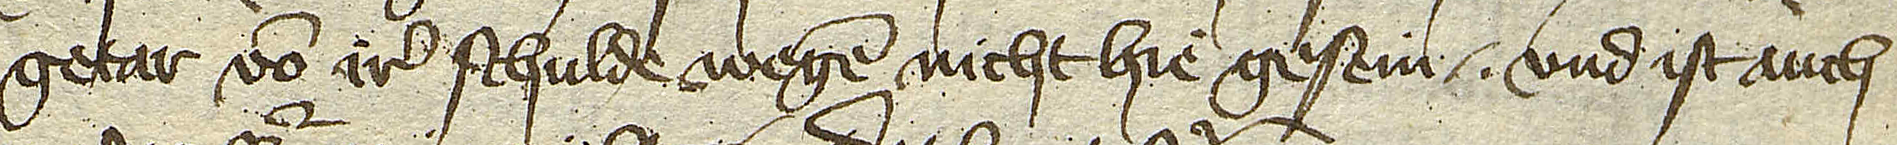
getar vo* ſchulde wege* nicht hie geſein / . vnd iſt auch
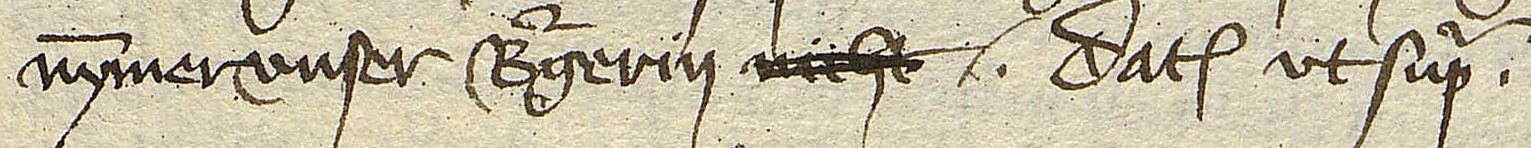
nymer* vnſer B*gerin nicht / . Dat* vt ſup*.
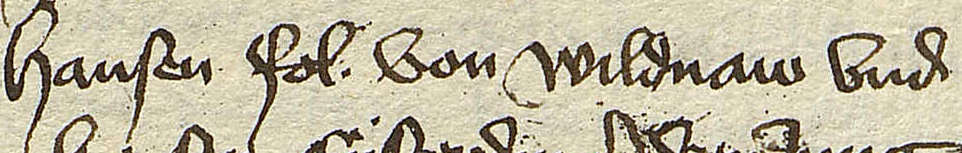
hanſen Fol. von wildnaw vnd
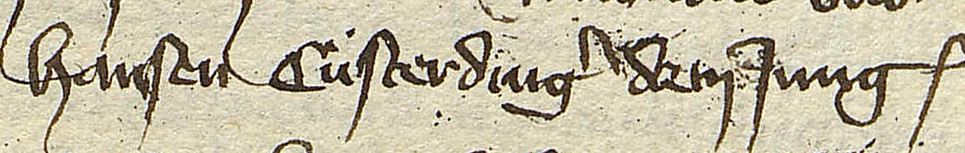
hanſen Cüſterding* dem Iung*
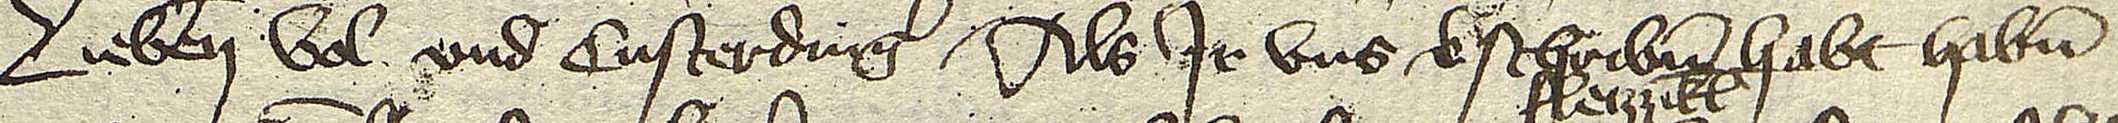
Liebn* Vol vnd Cuſterding* / Als Ir vns v*ſchribn* habt habn*
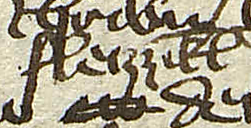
fleiʒʒikl*
